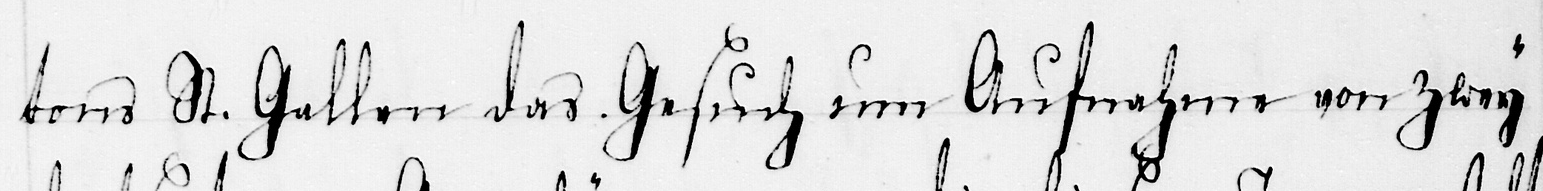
tons St. Gallen das Gesuch um Aufnahme von zwey
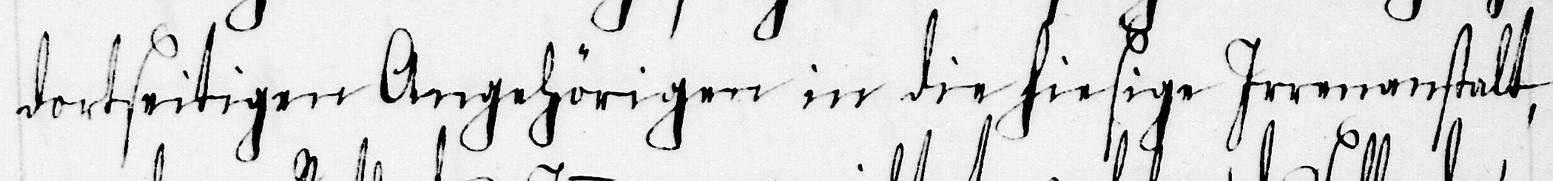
dortseitigen Angehörigen in die hiesige Irrenanstalt,
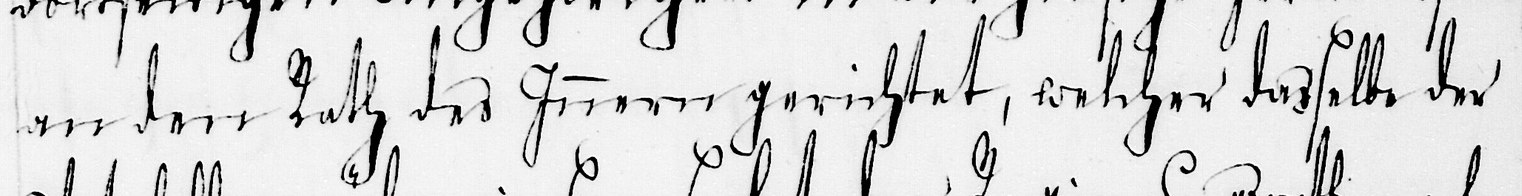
an den Rath des Innern gerichtet, welcher dasselbe der
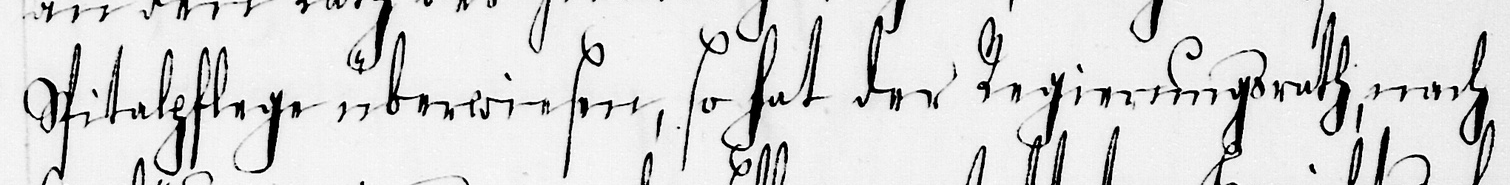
Spitalpflege überwiesen, so hat der Regierungsrath, nach
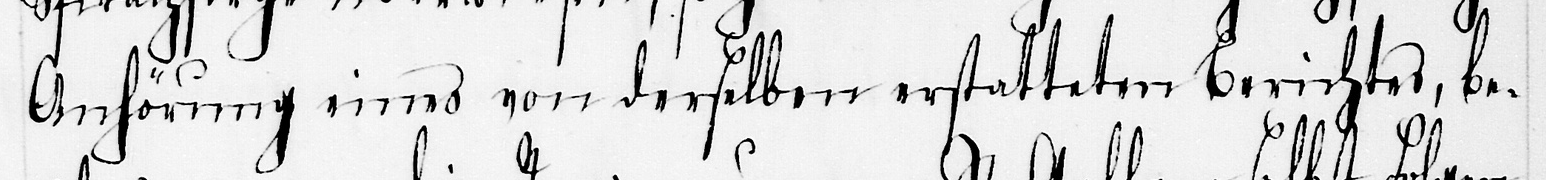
Anhörung eines von derselben erstatteten Berichtes, be¬
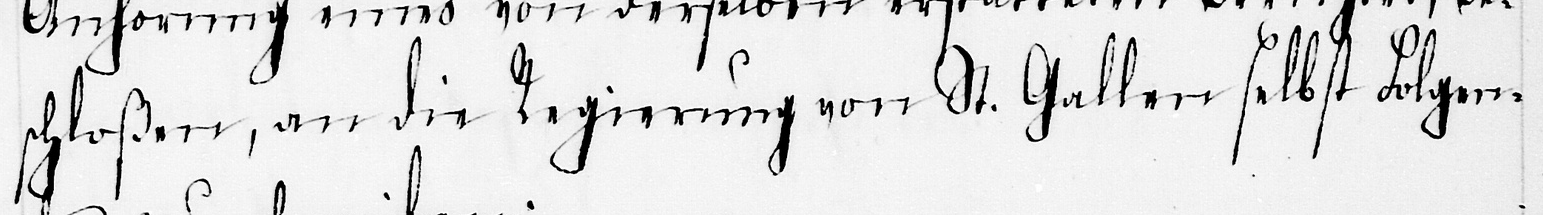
schloßen, an die Regierung von St. Gallen selbst Folgen¬
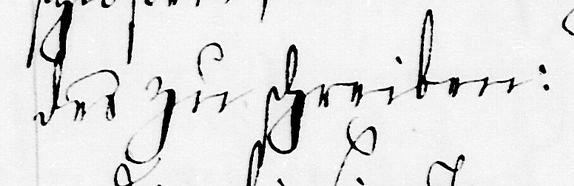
des zu schreiben:
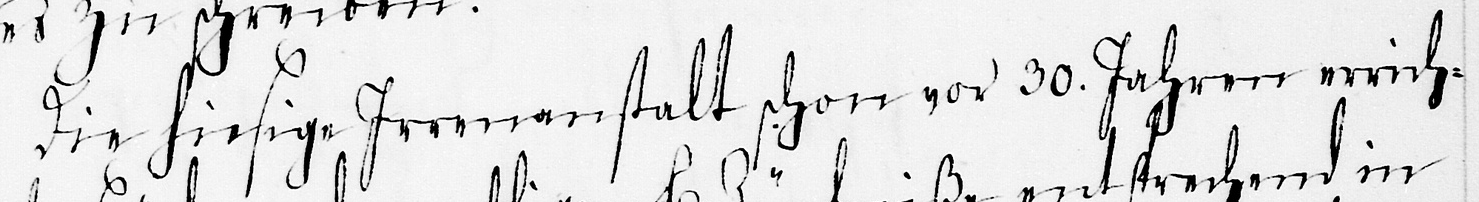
Die hiesige Irrenanstalt schon vor 30. Jahren errich¬
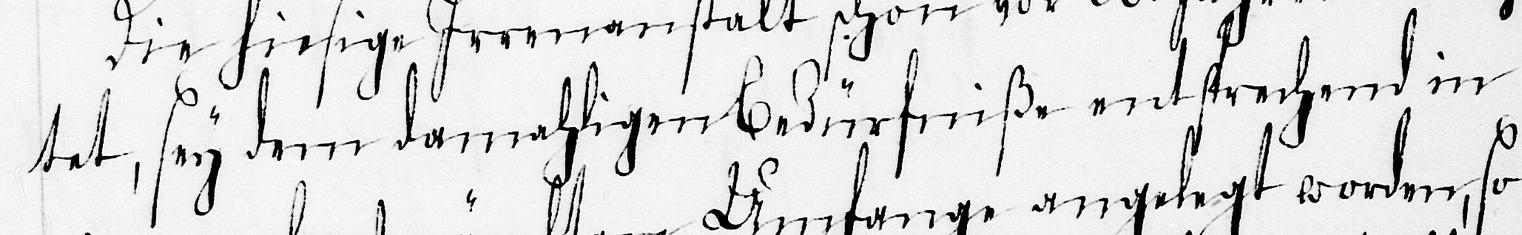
tet, sey dem damahligen Bedürfniße entsprechend in
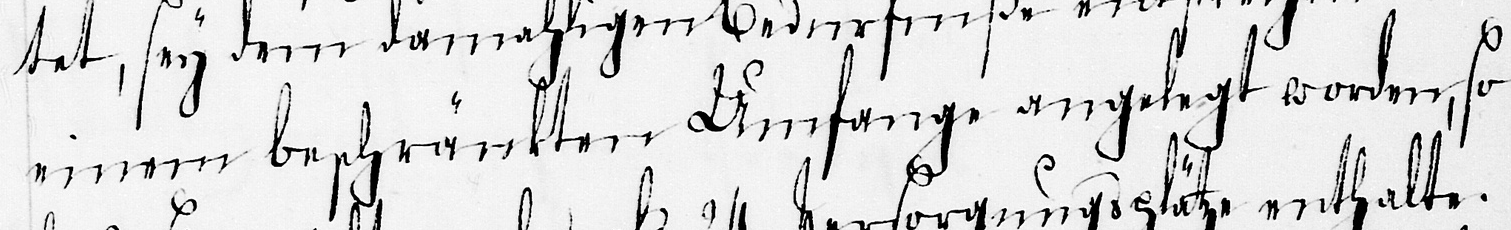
einem beschränkten Umfange angelegt worden, so
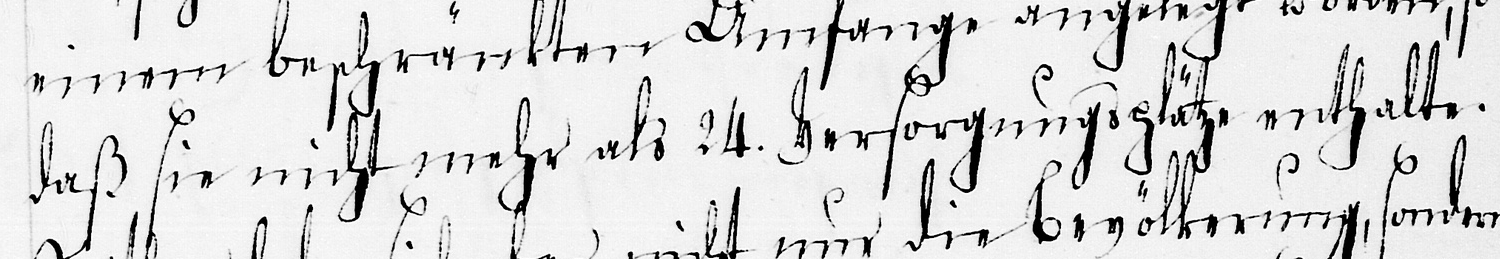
daß sie nicht mehr als 24. Versorgungsplätze enthalte.
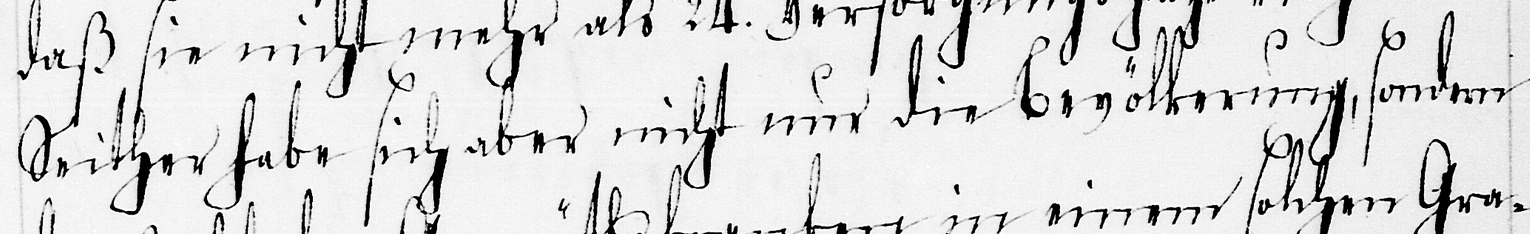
Seither habe sich aber nicht nur die Bevölkerung, sondern
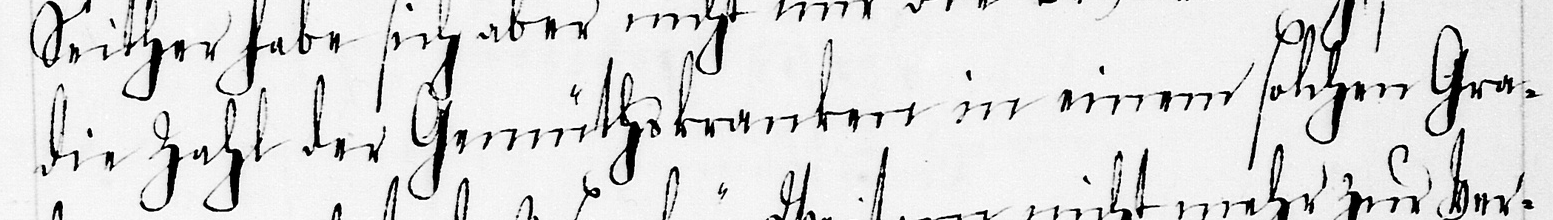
die Zahl der Gemüthskranken in einem solchen Gra¬
